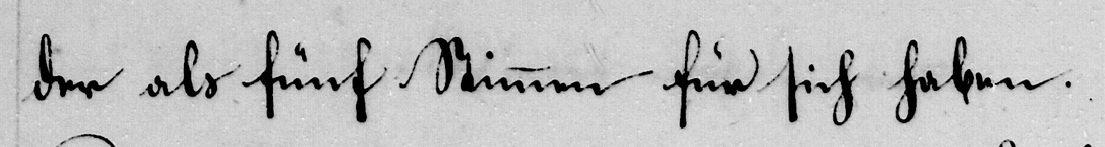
der als fünf Stimmen für sich haben.
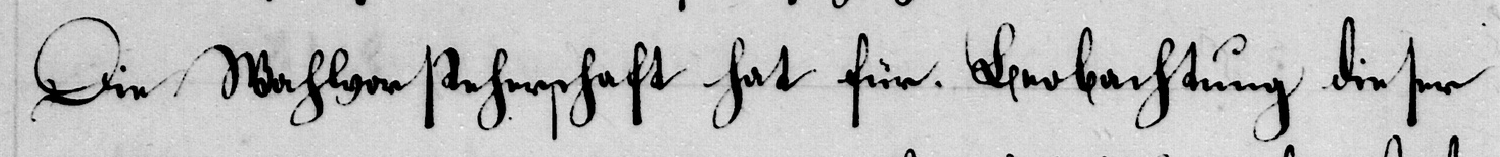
Die Wahlvorsteherschaft hat für Beobachtung dieser
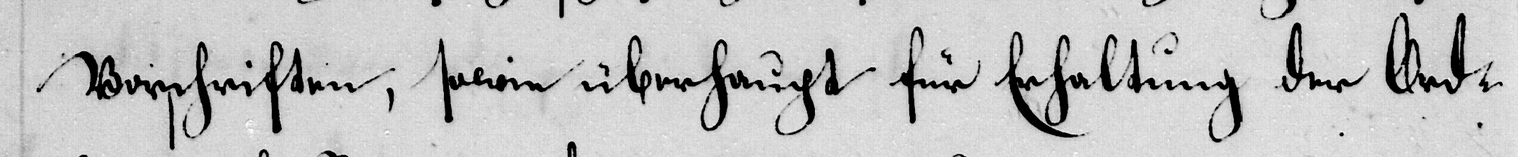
Vorschriften, sowie überhaupt für Erhaltung der Ord¬
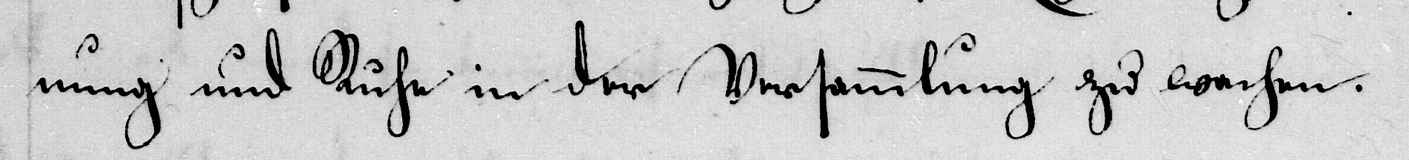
nung und Ruhe in der Versammlung zu wachen.
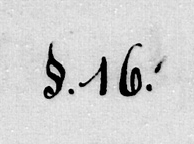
§.16.
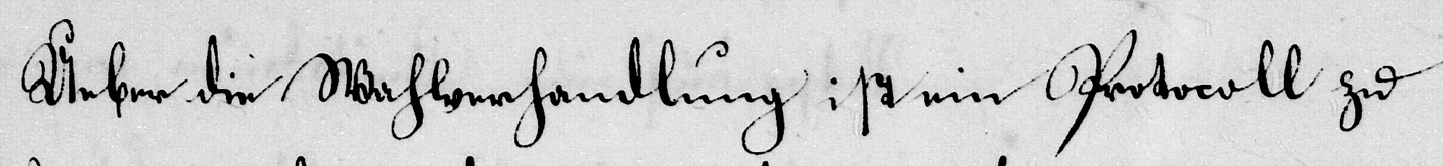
Ueber die Wahlverhandlung ist ein Protocoll zu
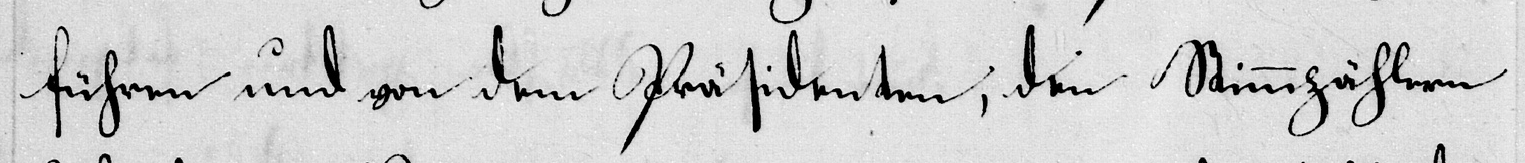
führen und von dem Präsidenten, den Stimmzählern
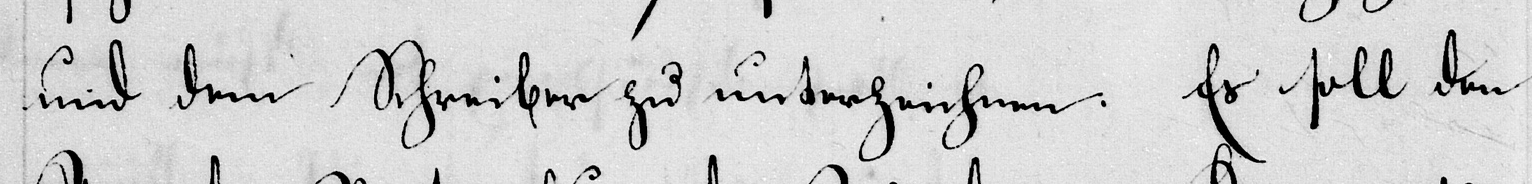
und dem Schreiber zu unterzeichnen. Es soll den
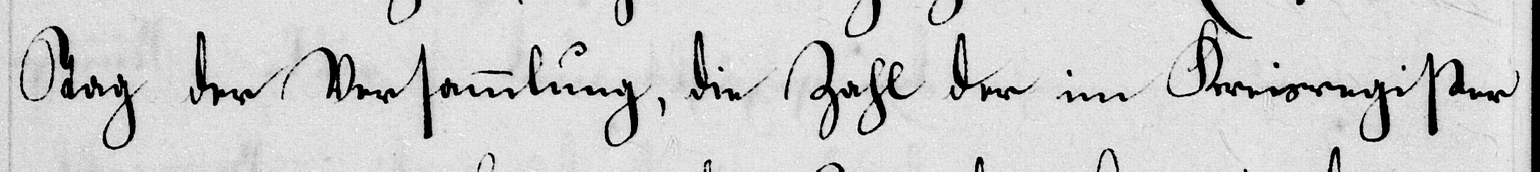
Tag der Versammlung, die Zahl der im Kreisregister
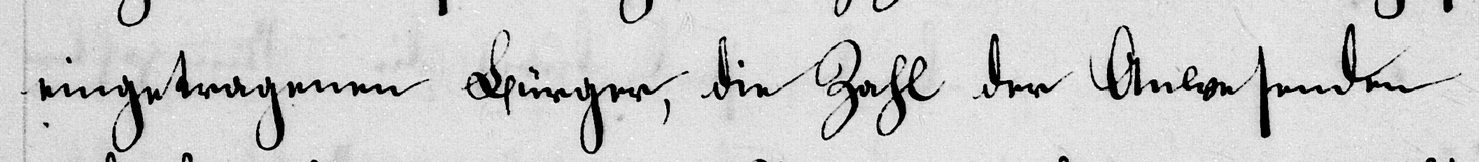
eingetragenen Bürger, die Zahl der Anwesenden
